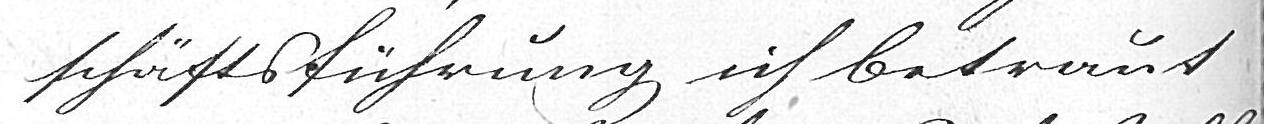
schäftsführung ich betraut
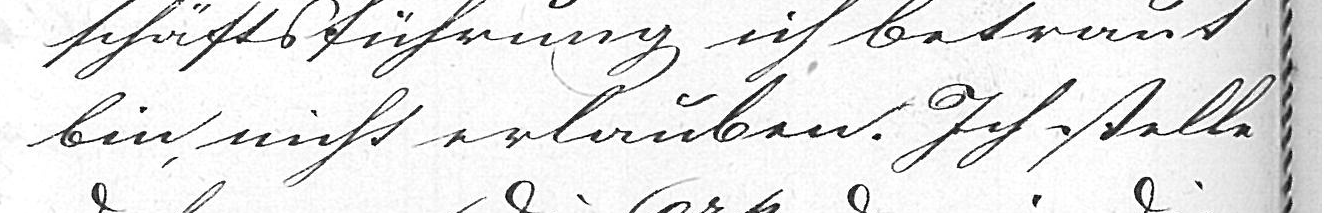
bin, nicht erlauben. Ich stelle
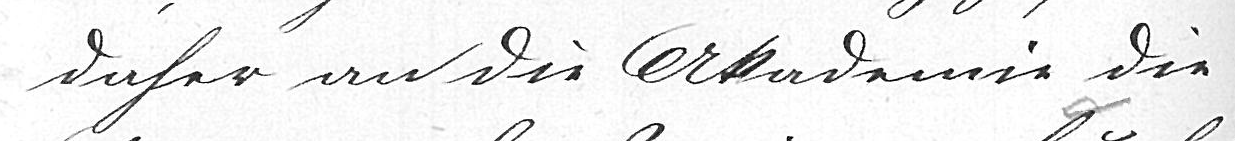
daher an die Akademie die
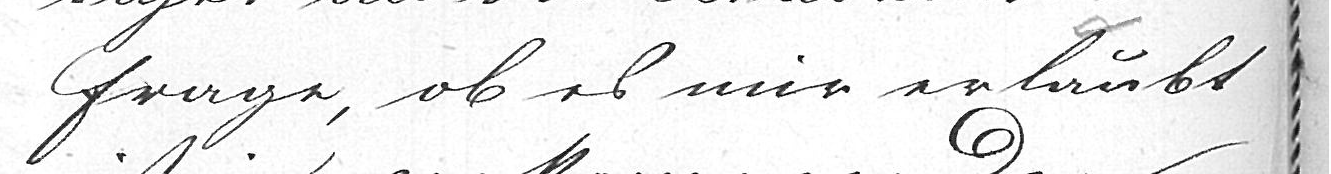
Frage, ob es mir erlaubt
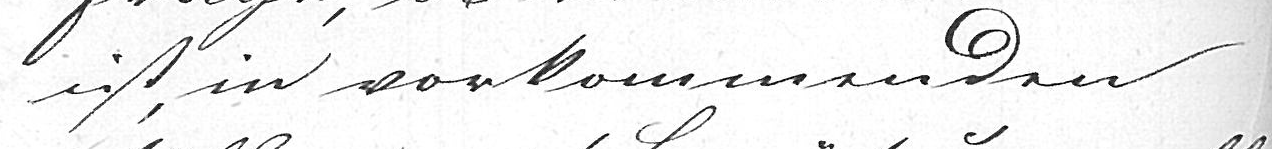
ist, in vorkommenden
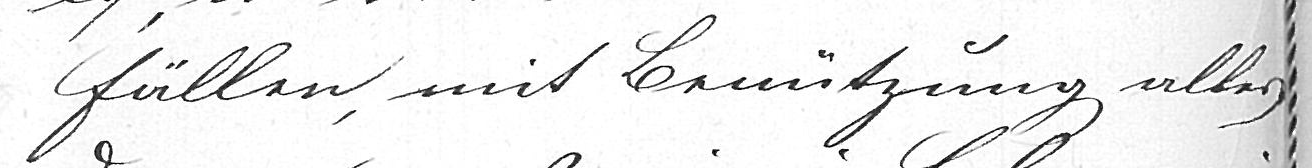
Fällen, mit Benützung alles
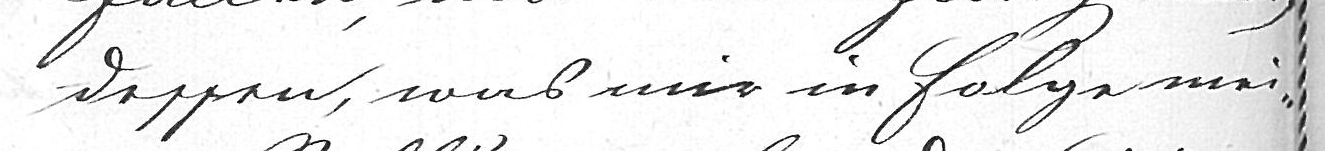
dessen, was mir in Folge mei-
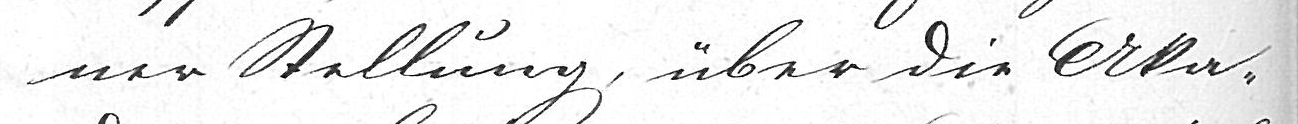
ner Stellung, über die Aka-
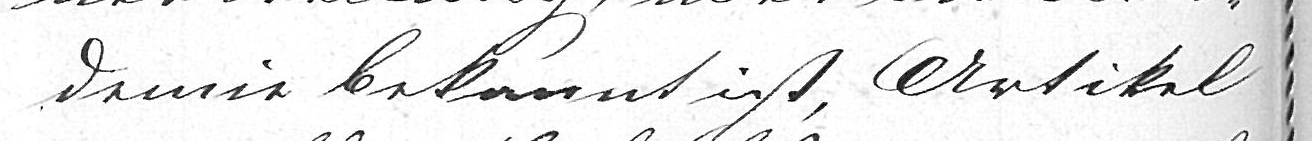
demie bekannt ist, Artikel
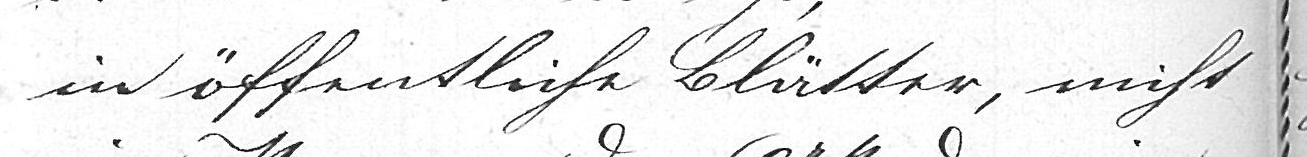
in öffentlichen Blätter, nicht
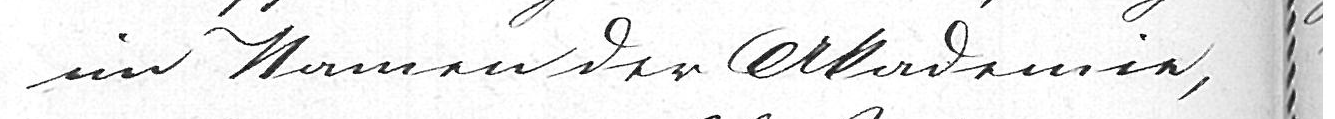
im Namen der Akademie,
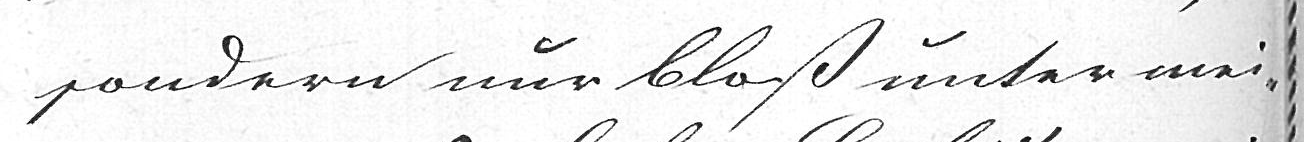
sondern nur bloß unter mei-
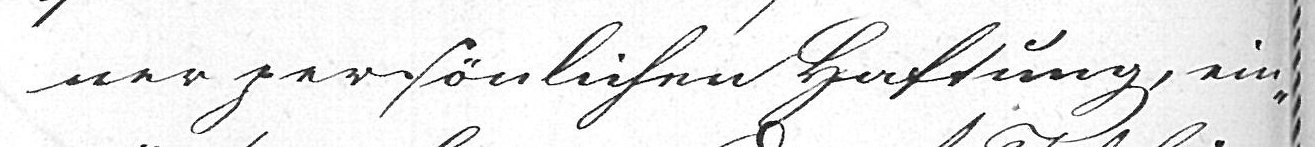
ner persönlichen Haftung, ein-
